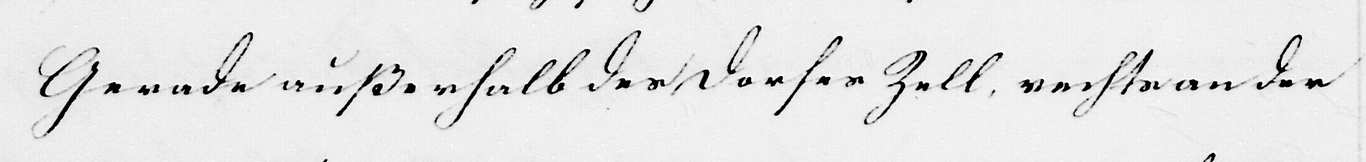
Gerade außerhalb des Dorfes Zell, rechts an der
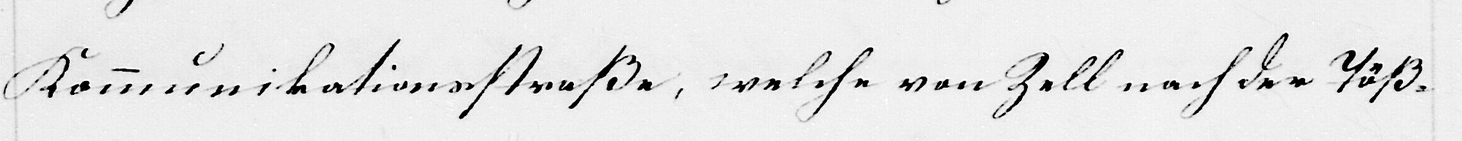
Kommunikationsstraße, welche von Zell nach der Töß¬
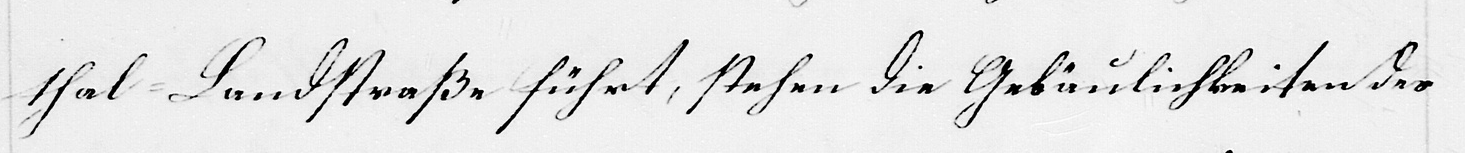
thal-Landstraße führt, stehen die Gebäulichkeiten des
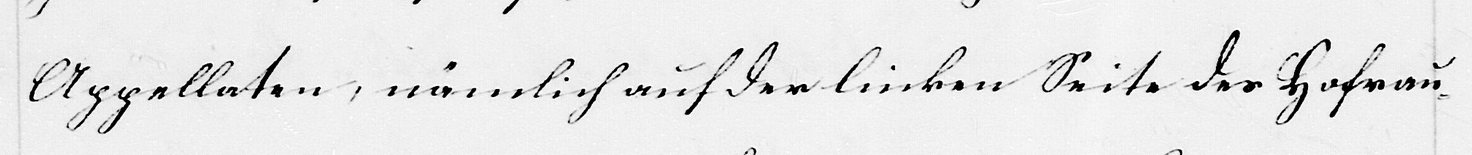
Appellaten, nämlich auf der linken Seite des Hofrau¬
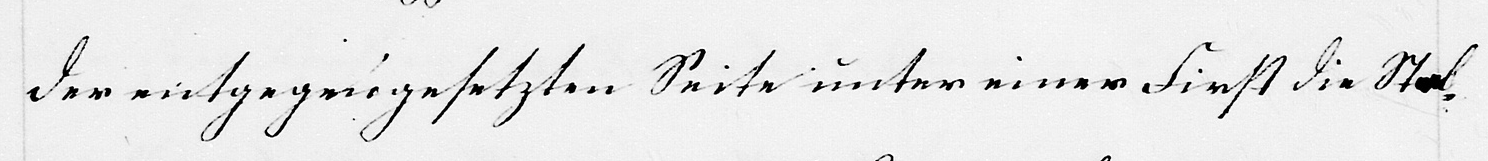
der entgegengesetzten Seite unter einer First die Stal¬
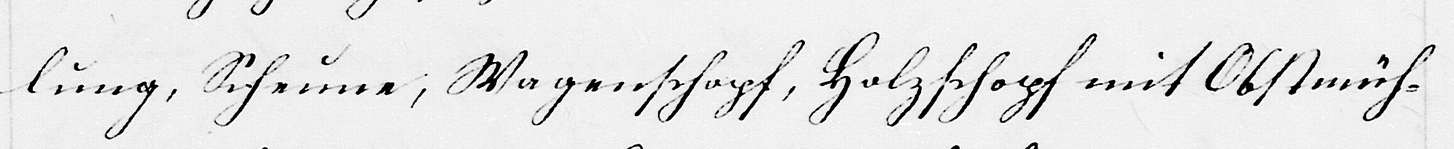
lung, Scheune, Wagenschopf, Holzschopf mit Obstmüh¬
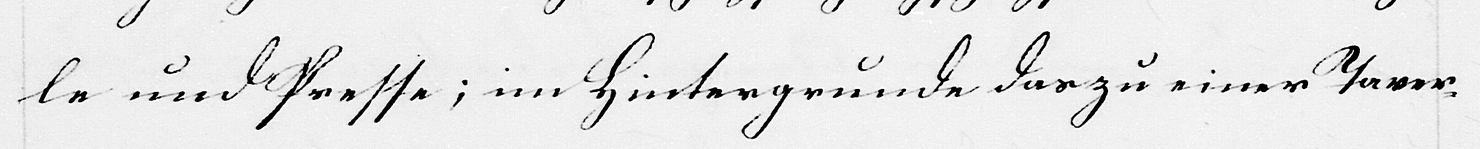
le und Presse; im Hintergrunde das zu einer Taver¬
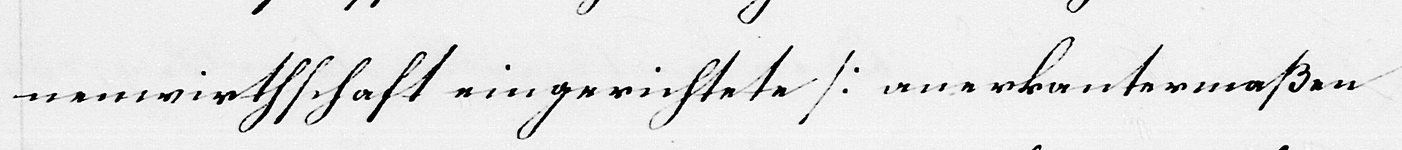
nenwirthschaft eingerichtete [anerkantermaßen
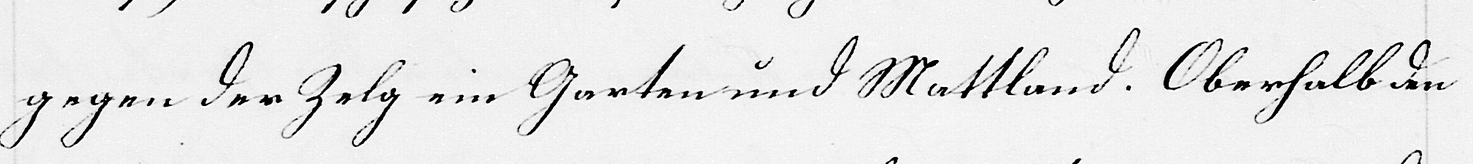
gegen der Zelg ein Garten und Mattland. Oberhalb den
